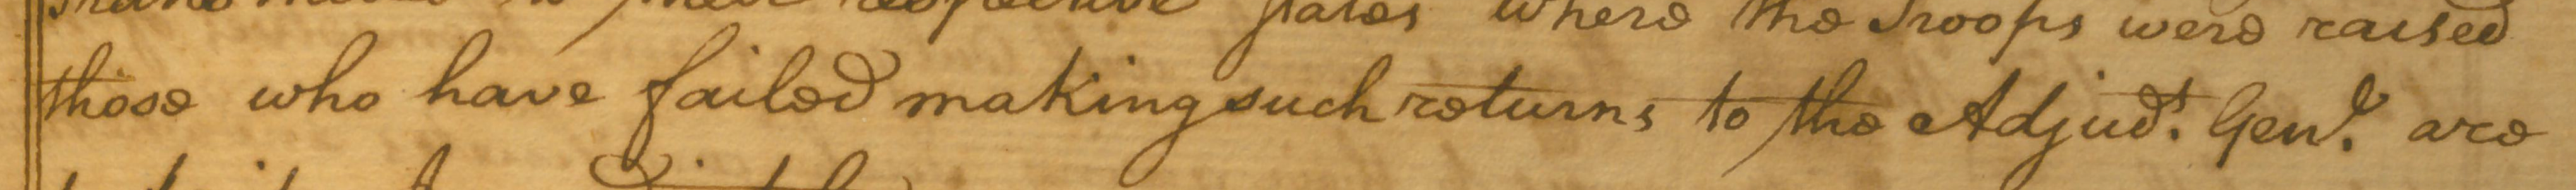those who have failed making such returns to the Adjud^t. Gen^l. are
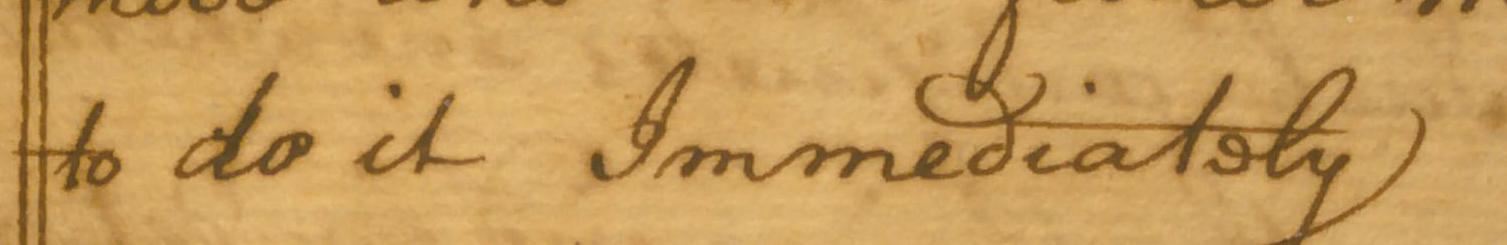to do it Immediately
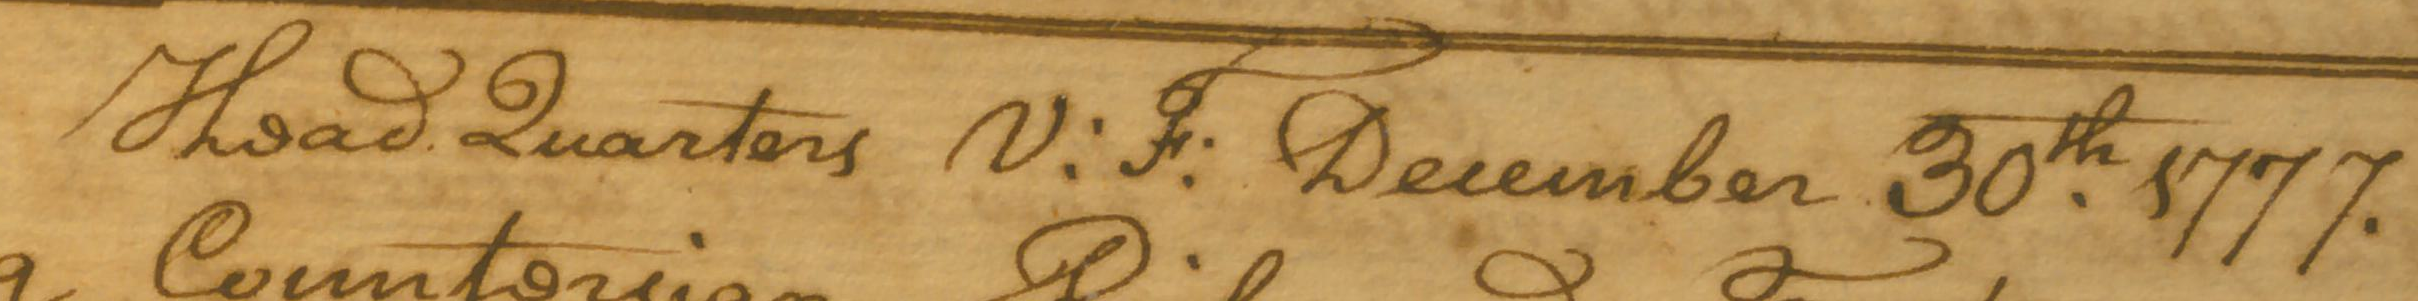Head Quarters V: F: December 30^th. 1777.
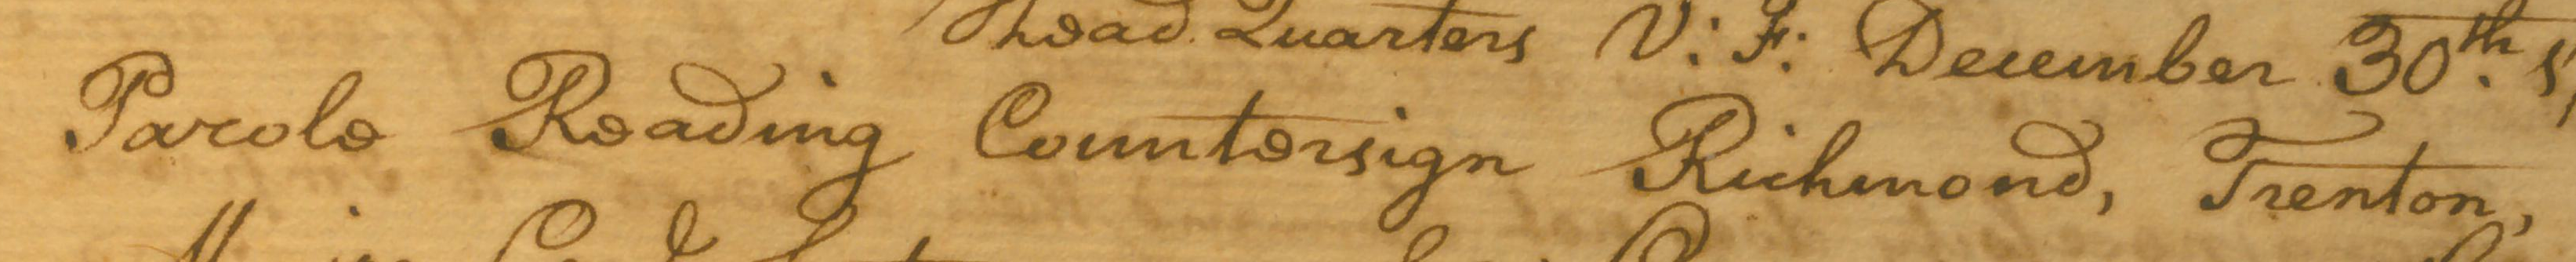Parole Reading Countersign Richmond, Trenton,
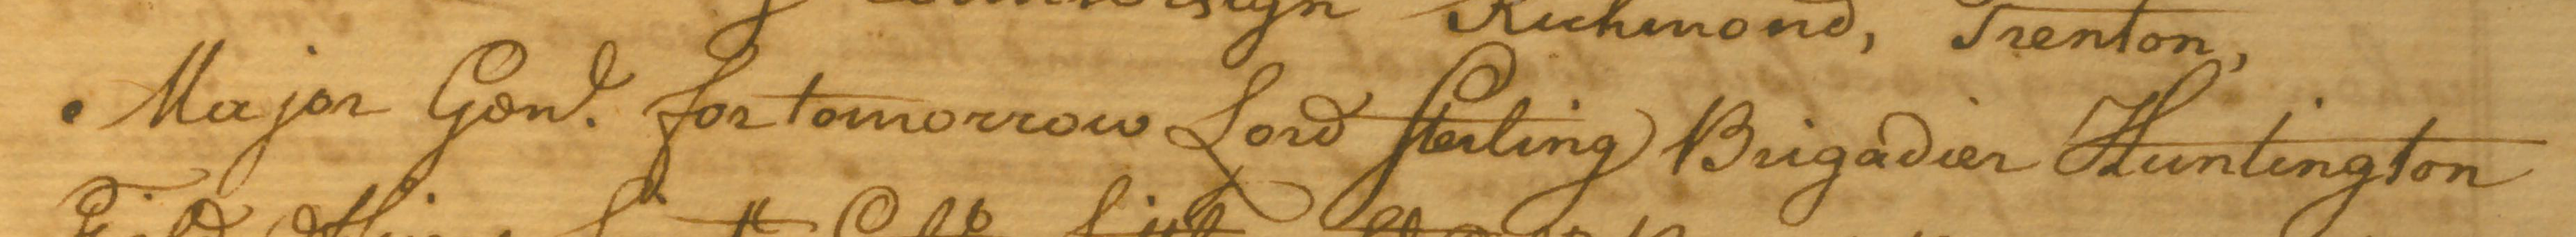Major Gen^l. for tomorrow Lord Sterling Brigadier Huntington
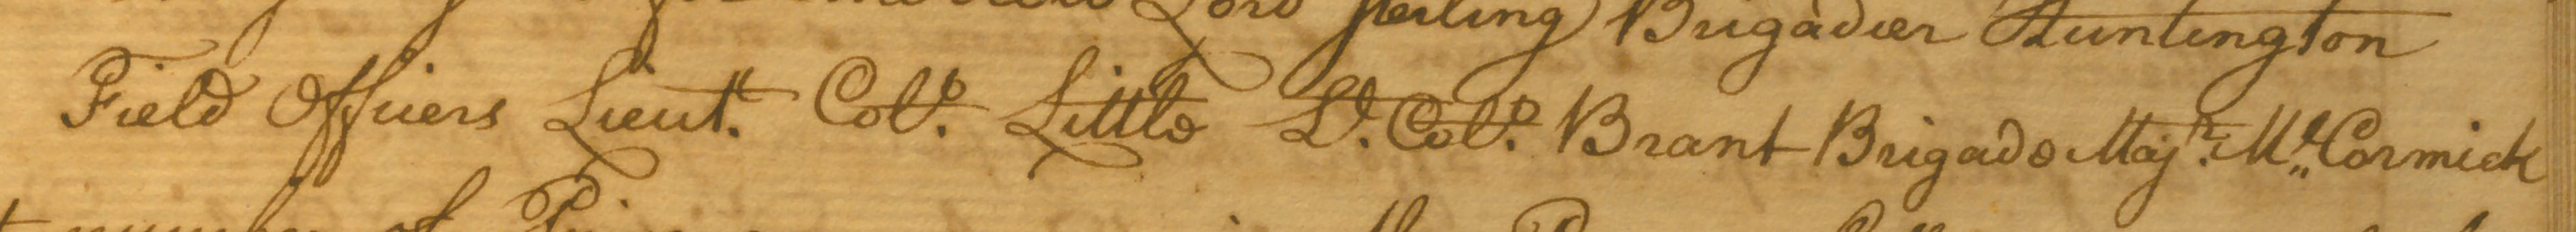Field Officers Lieut^t. Col^o. Little L^t. Col^o. Brant Brigade Maj^r. M^c.Cormick
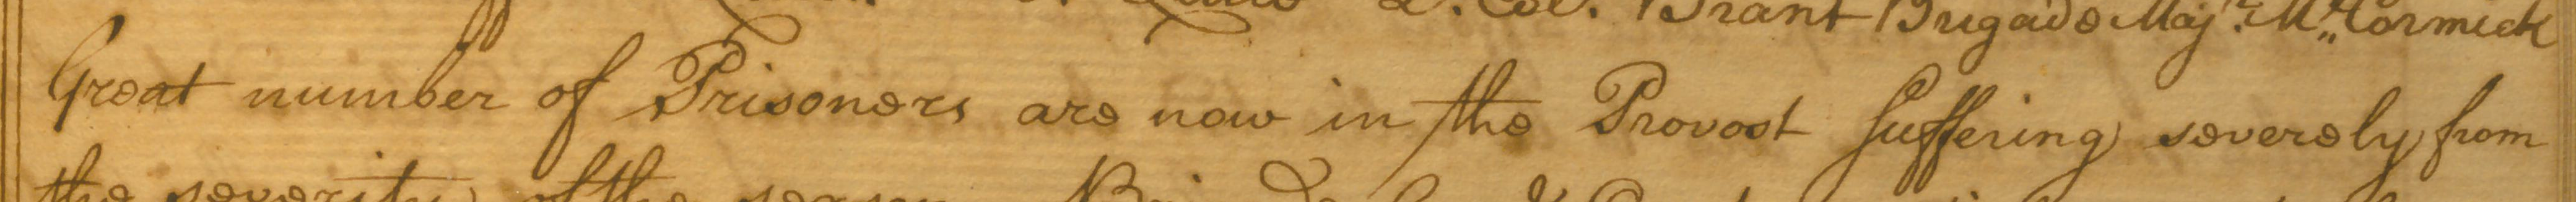Great number of Prisoners are now in the Provost suffering severely from
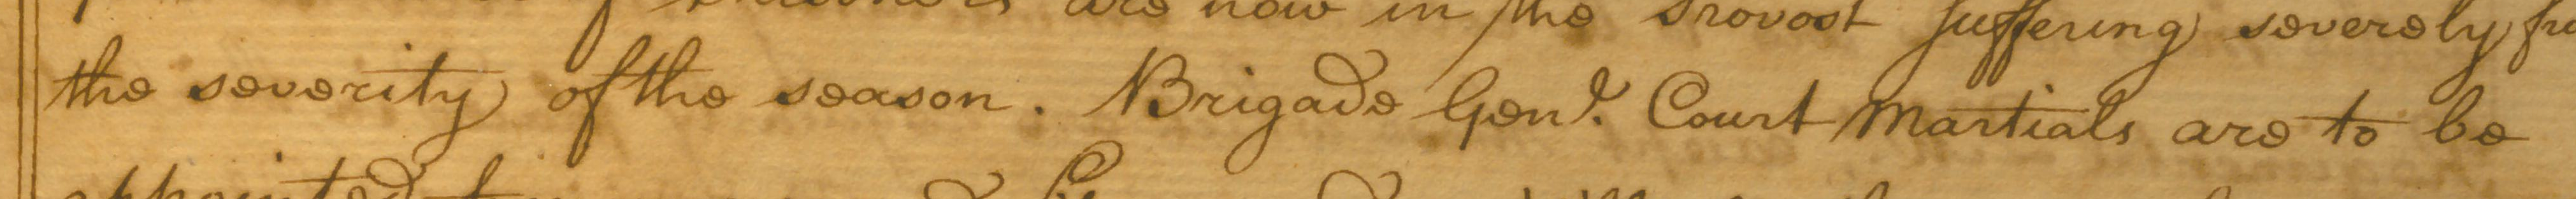the severity of the season. Brigade Gen^l. Court Martials are to be
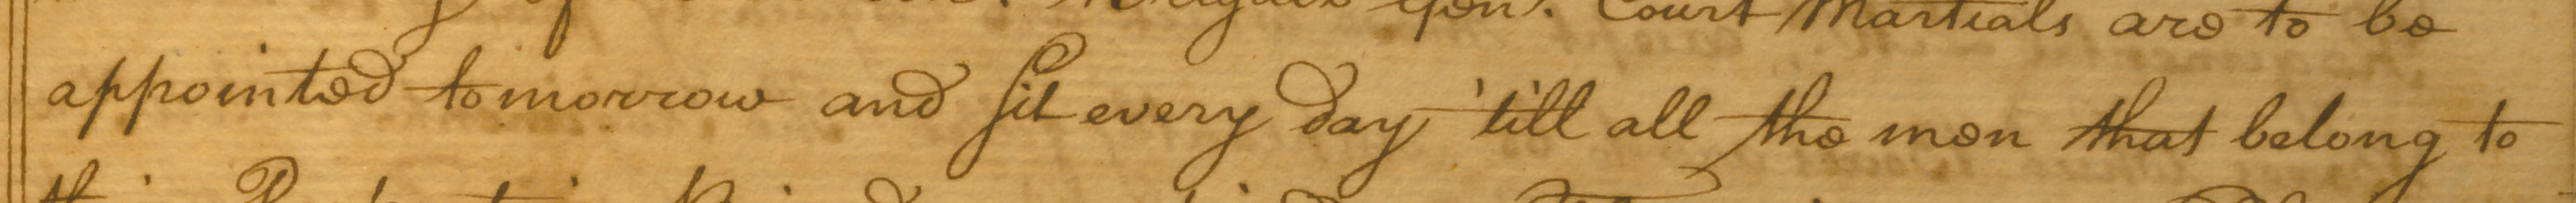appointed tomorrow and sit every day 'till all the men that belong to
